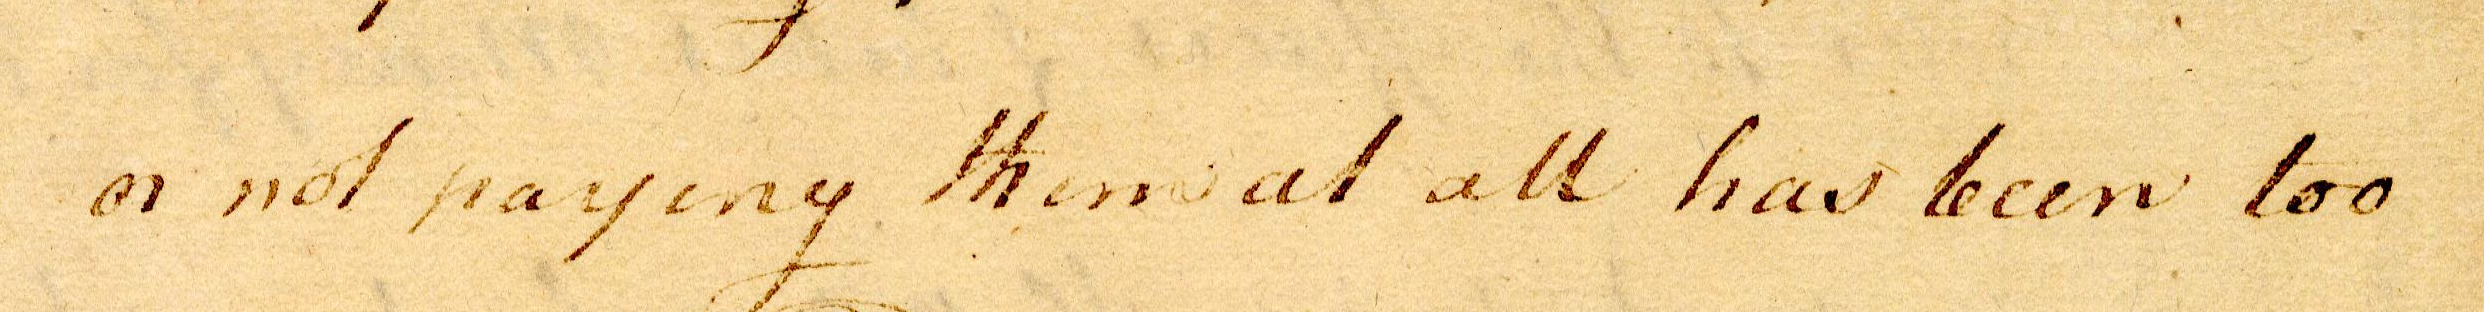or not paying them at all has been too
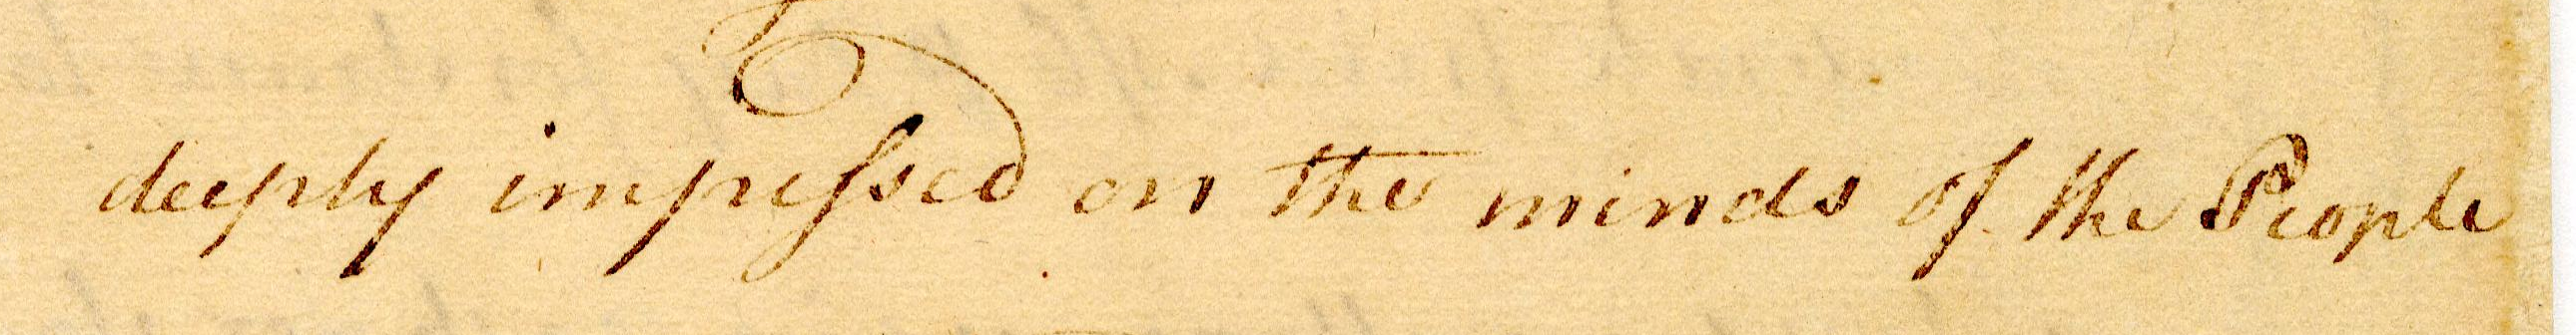deeply impressed on the minds of the People
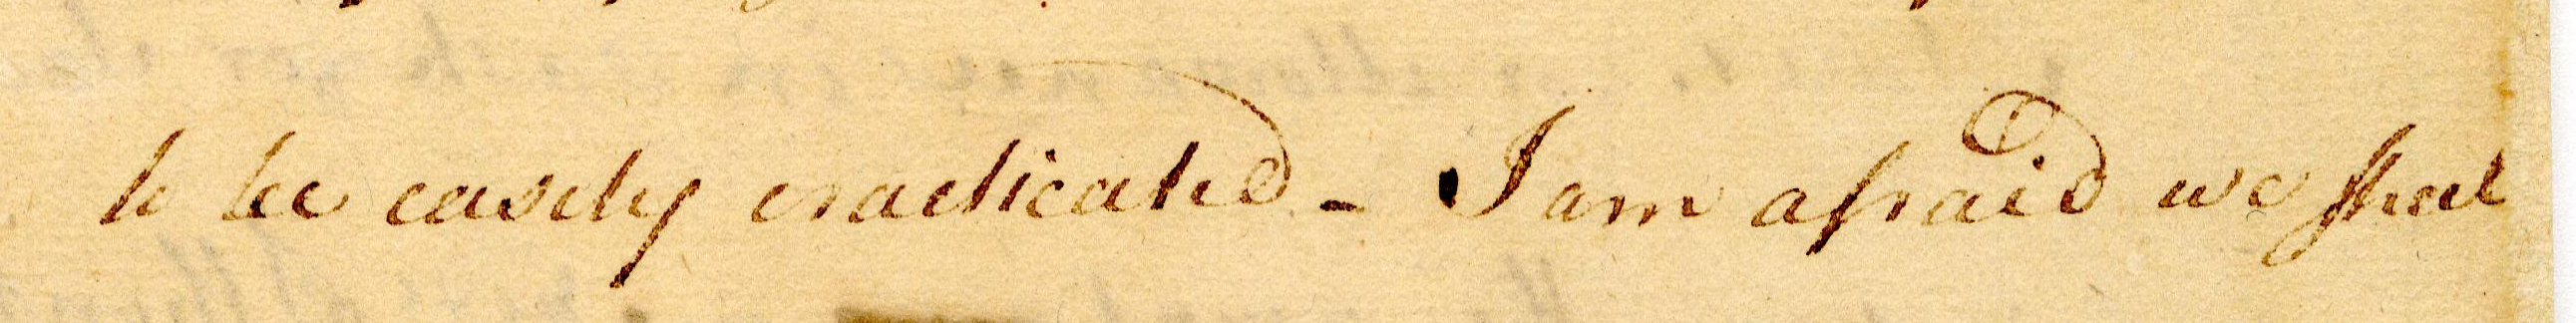to be easily eradicated. I am afraid we shal
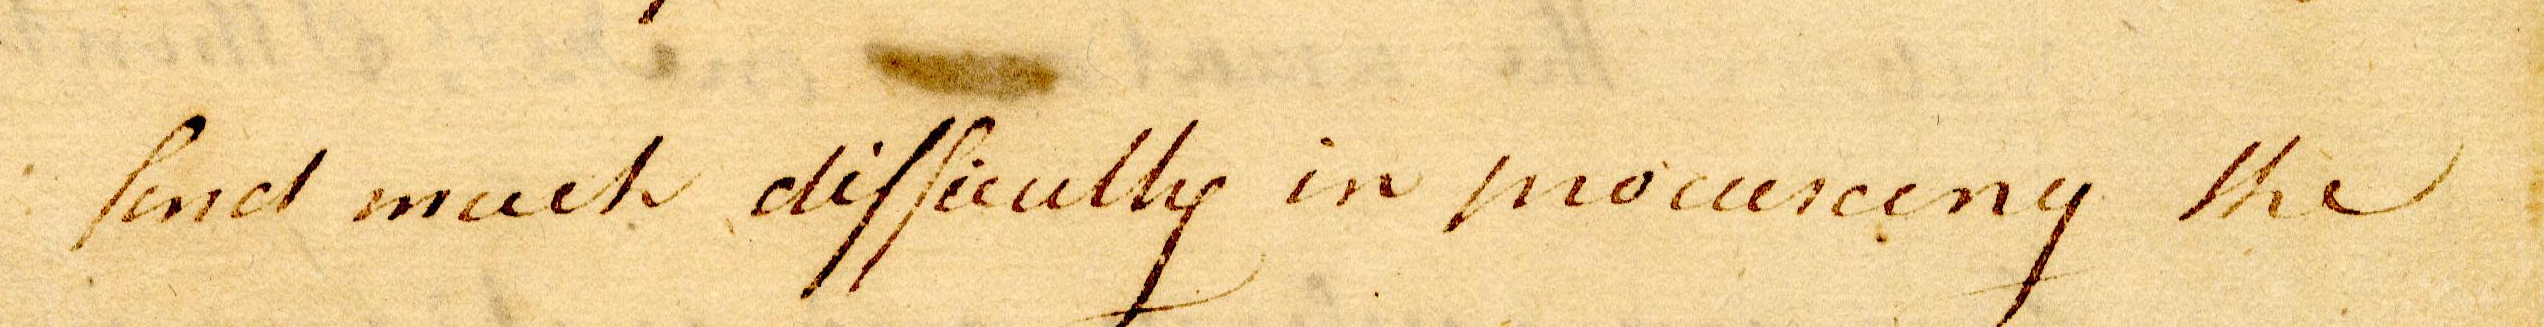find much difficulty in procuring the
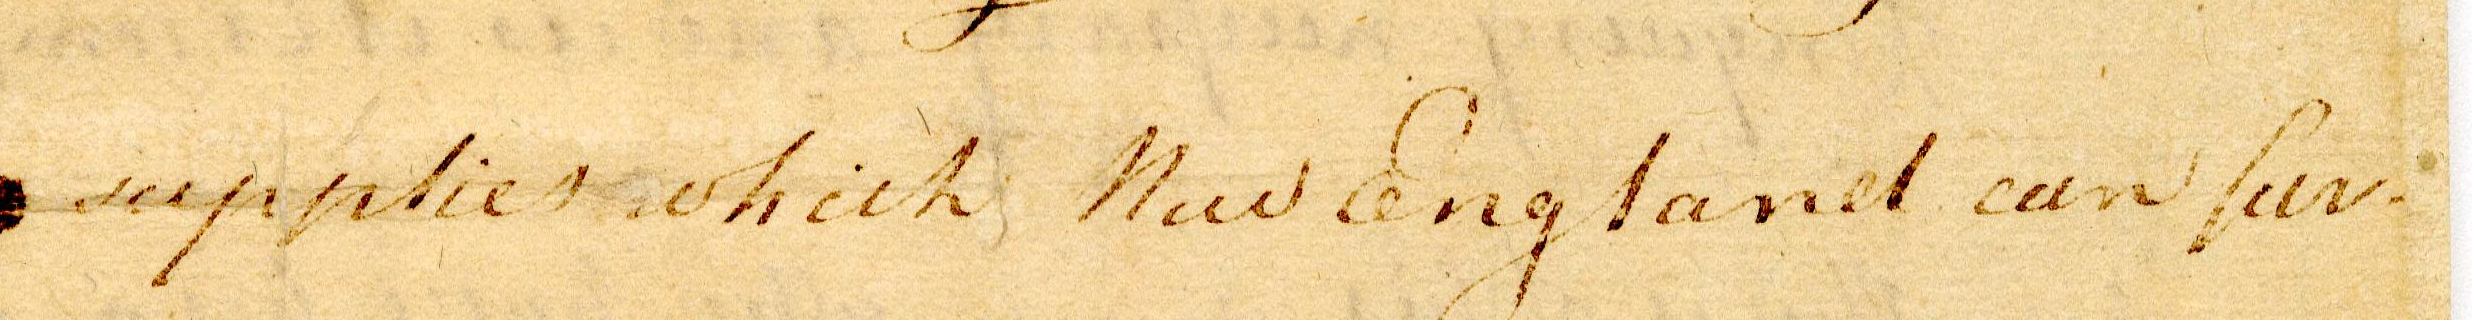supplies which New England can fur-
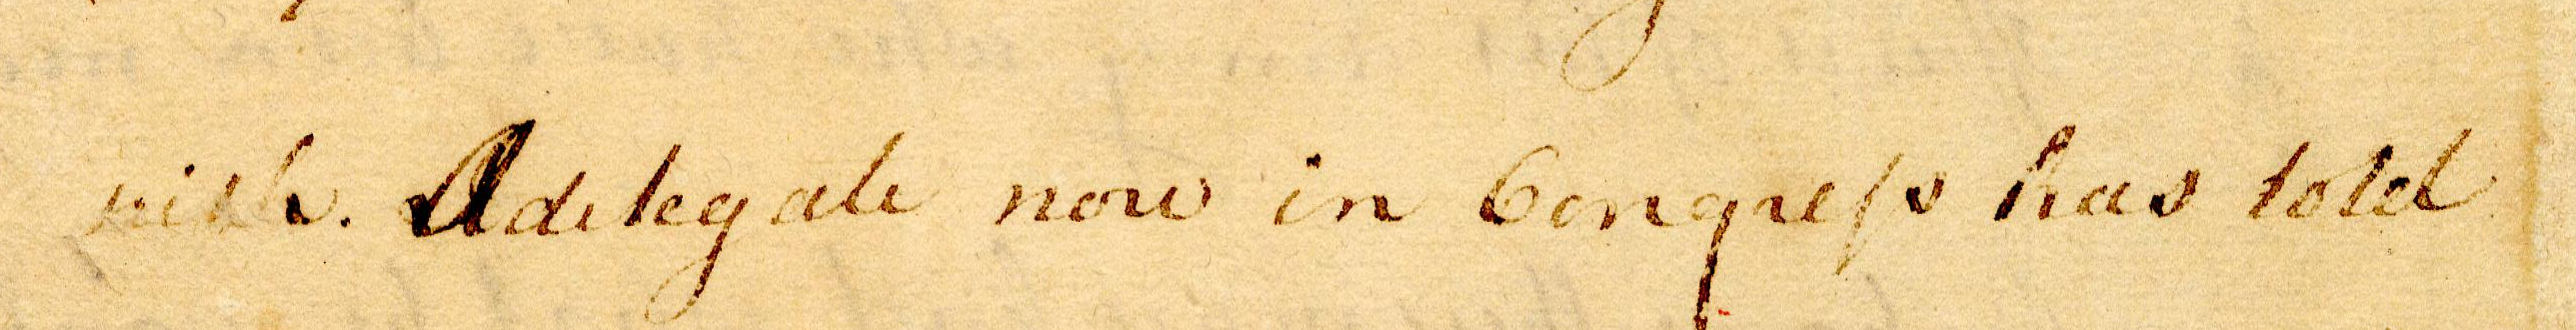nish. A delegate now in Congress has told
